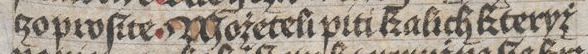czo proſite.Možeteli píti kalich kteryż
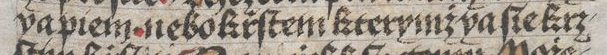ya píem.nebo křſtem kterýmž ya ſíe krz¬
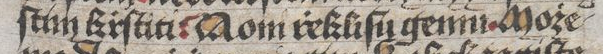ſtím kṙſtiti?A oni ṙekli ſu gemu.Może¬
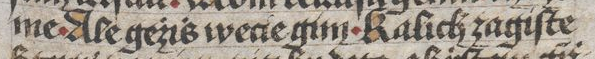me.Ale geżíṡ weċie gim.Kalich zagiſte
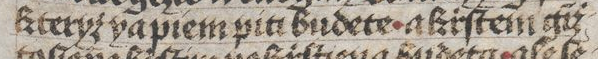kteryž ya píem piti budete.a kṙſteni giż
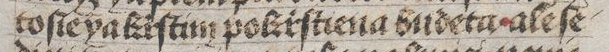to ſíe ya kṙſtím pokṙẛtiena budeta.ale ſe¬
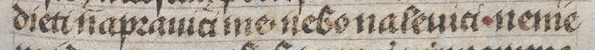dieti na prauici me.nebo naleuiti.neníe
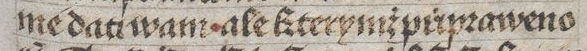mé dati vam.ale kterymż pṙipraweno
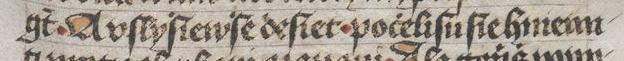ḡt.A vſlyẛíewẛe deſiet.poċeliſu ſie hniewa¬
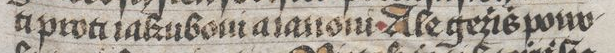ti priti iakuboui a ianoui.Ale gežíš powo¬
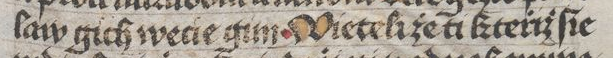law gich wecie gim.Víeteli że ti kteṙiż ſie
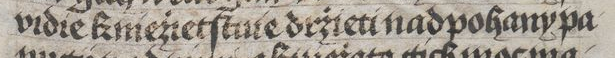vídíe kníeżietſuíe drżieti nadpohany pa¬
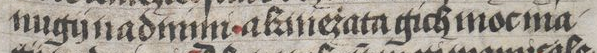nugij nadnimi.a knieżata gich moc ma¬
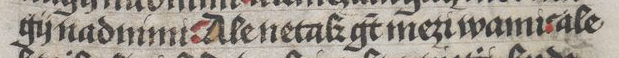gij nad nimi?Ale ne tak ḡt mezi wami?ale
